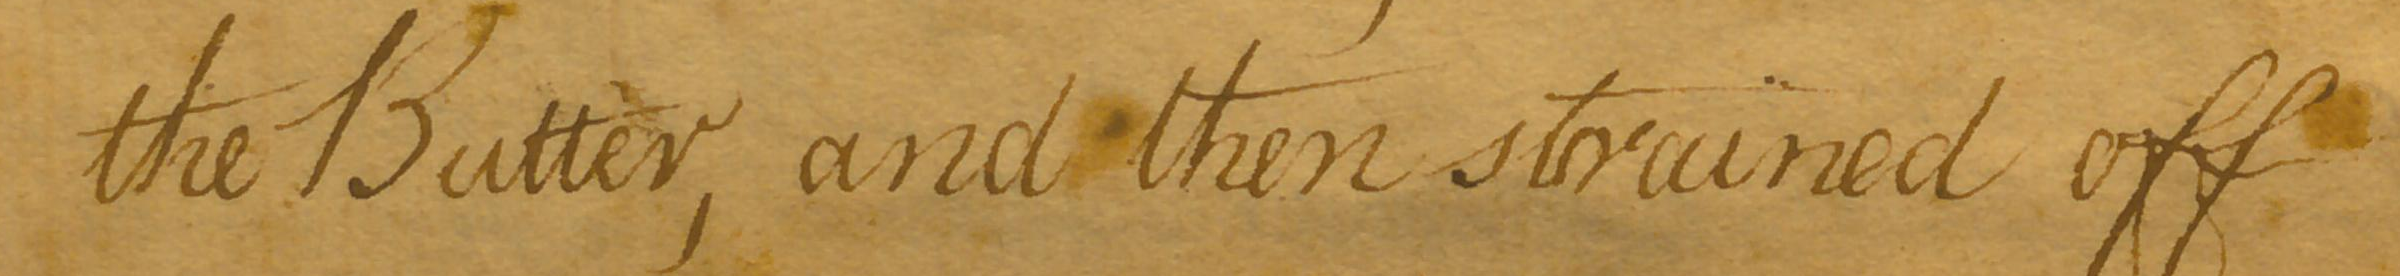the Butter, and then strained off
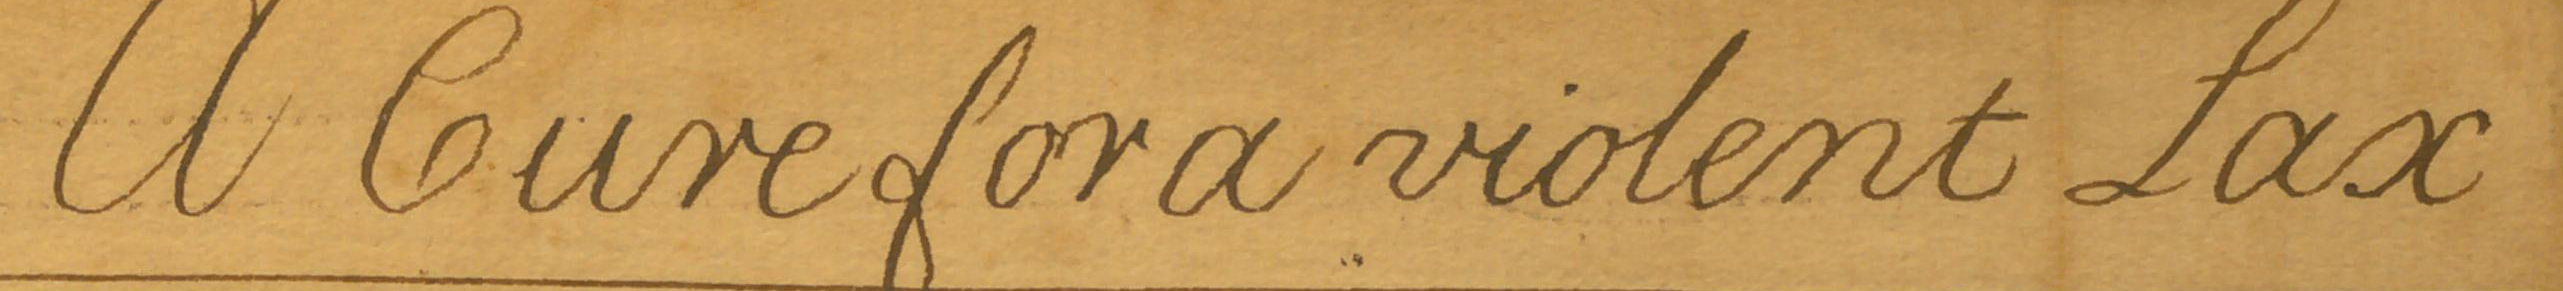A Cure for a violent Lax
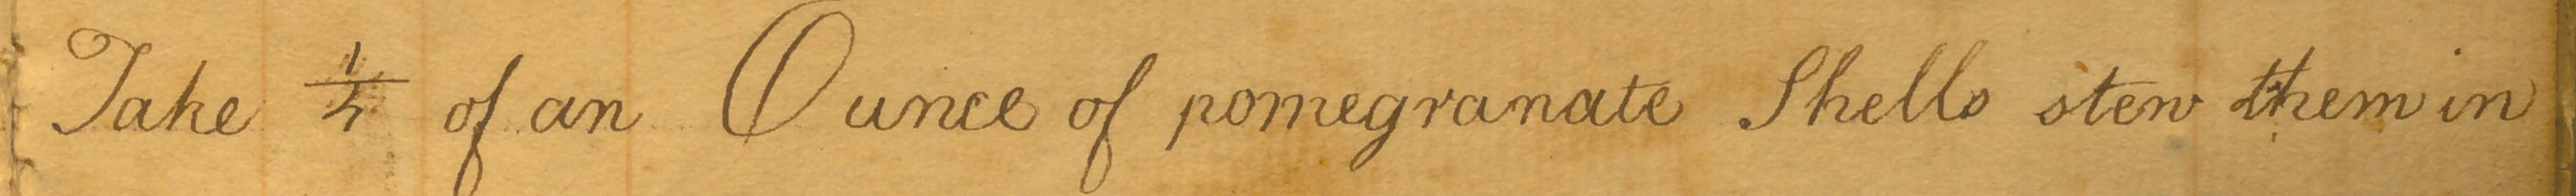Take 1/4 of an ounce of pomegranate Shells stew them in
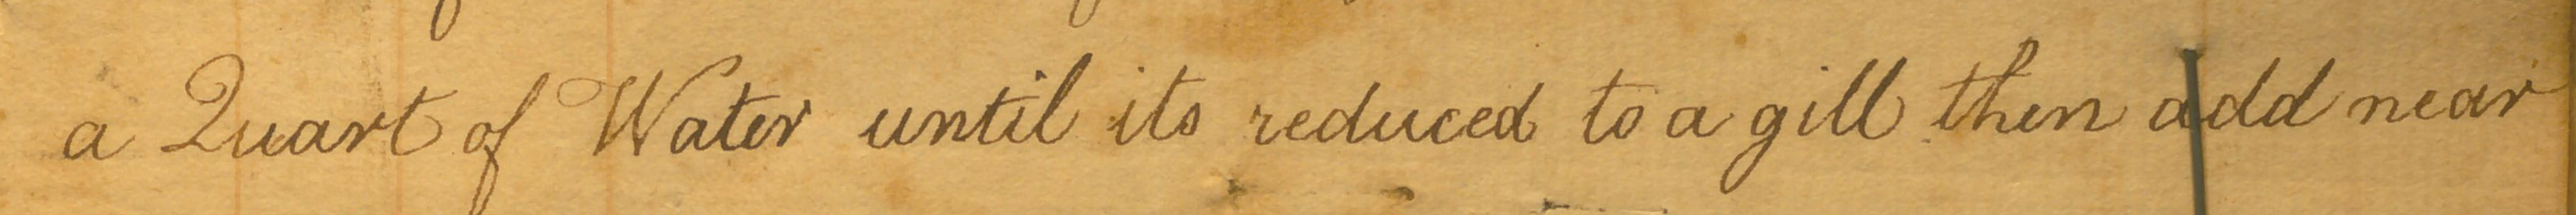a Quart of Water until its reduced to a gill then add near
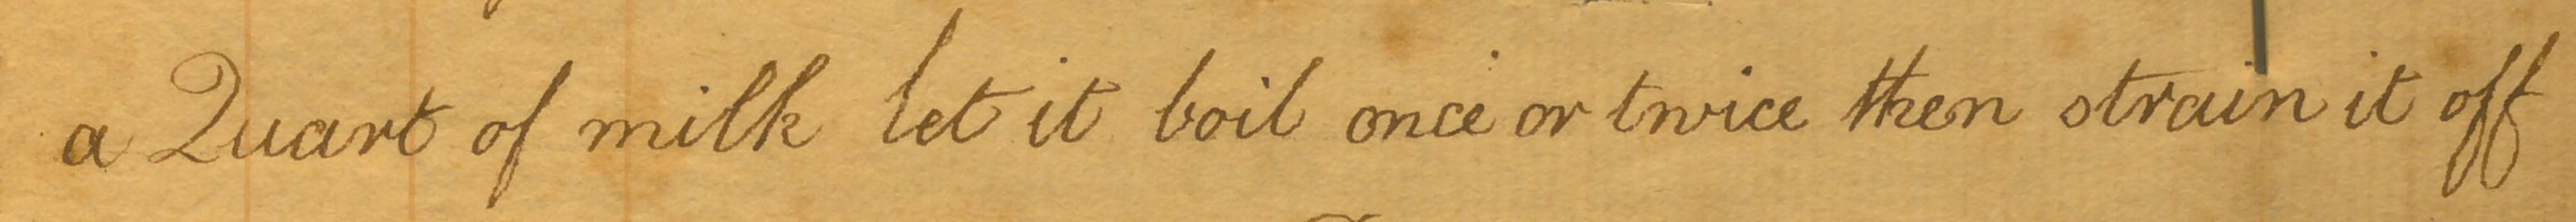a Quart of milk let it boil once or twice then strain it off
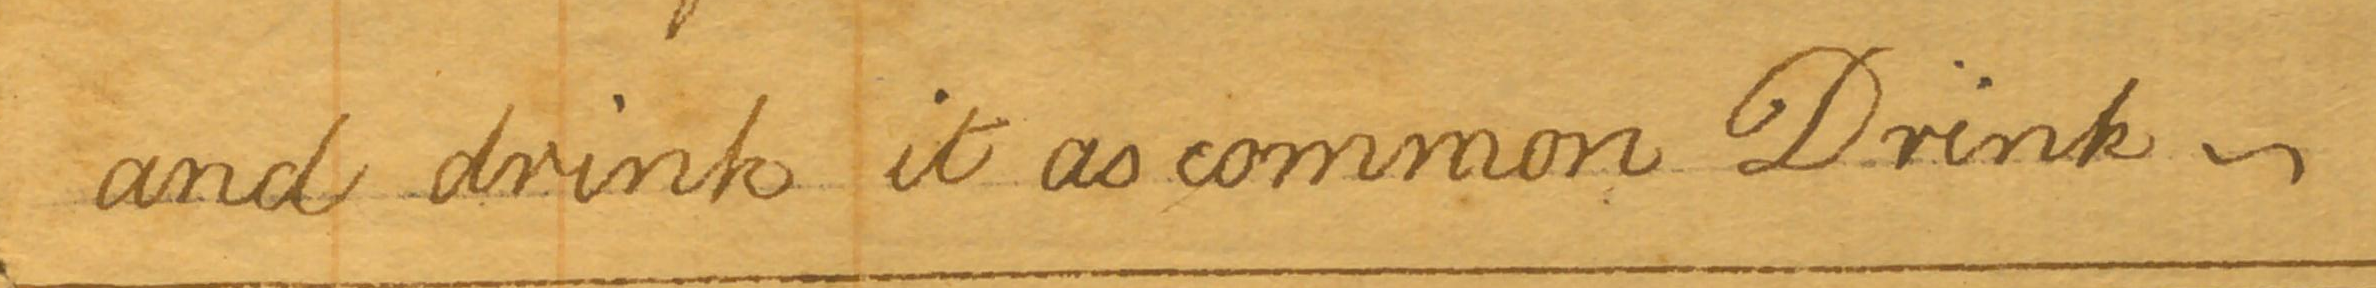and drink it as common Drink-
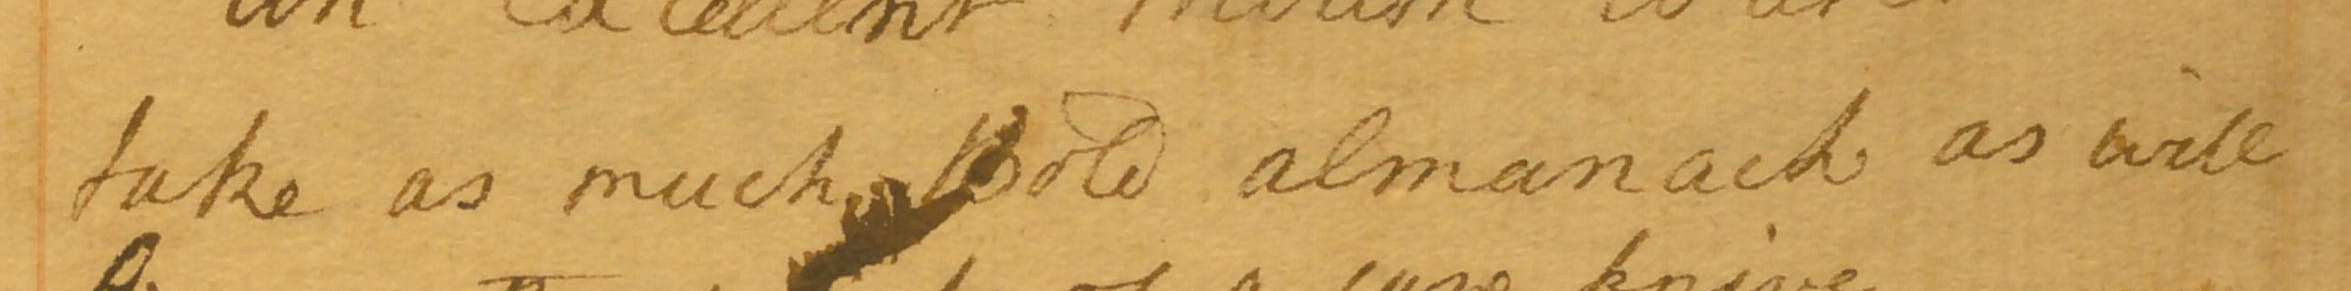take as much [_]old almanach as will
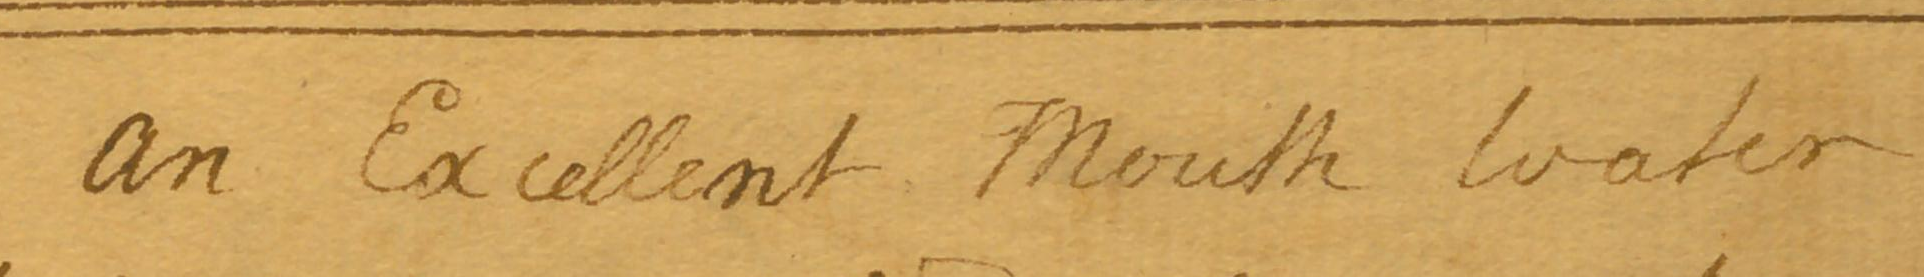an Excellent Mouth Water
